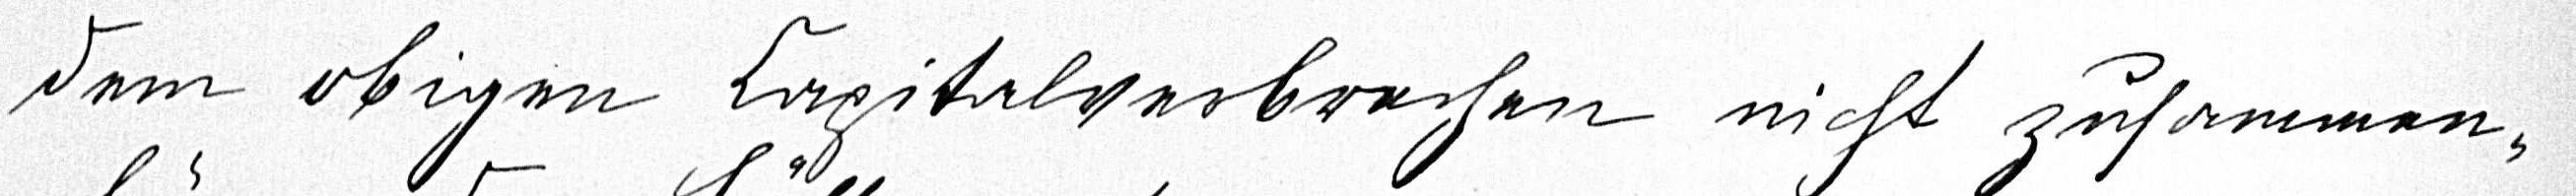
dem obigen Capitalverbrechen nicht zusammen¬
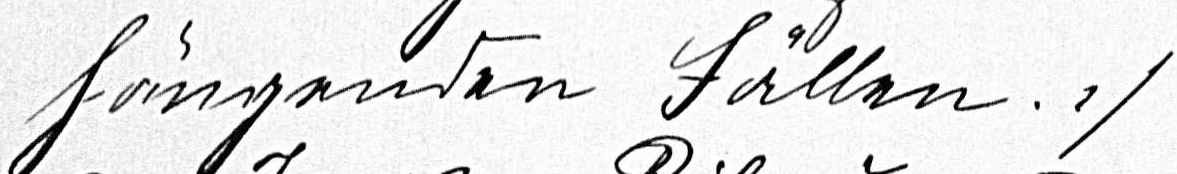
hängenden Fällen)
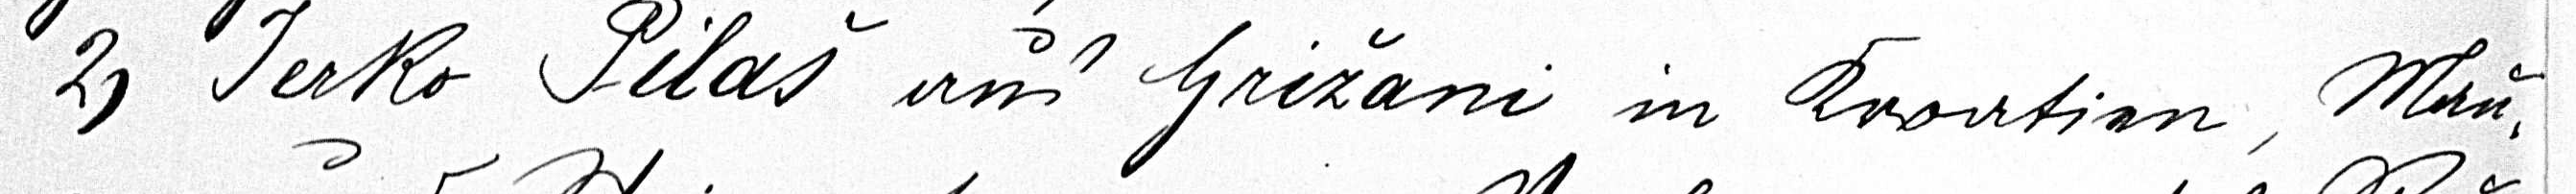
2) Jerko Pilaš aus Grižani in Kroatien, Mau¬
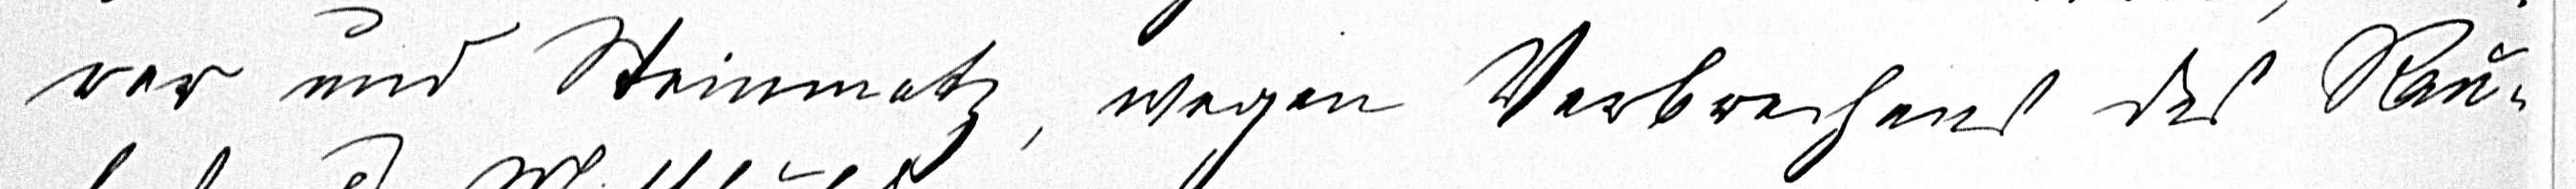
rer und Steinmetz wegen Verbrechens des Rau¬
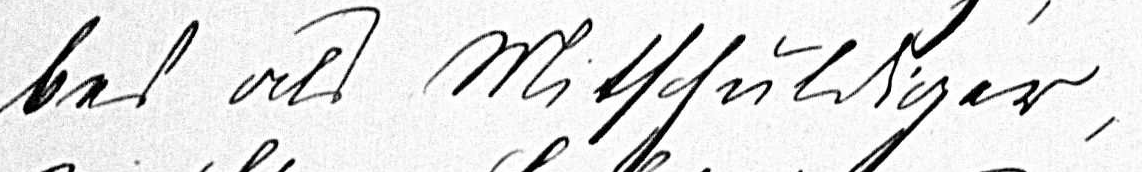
bes als Mitschuldiger,
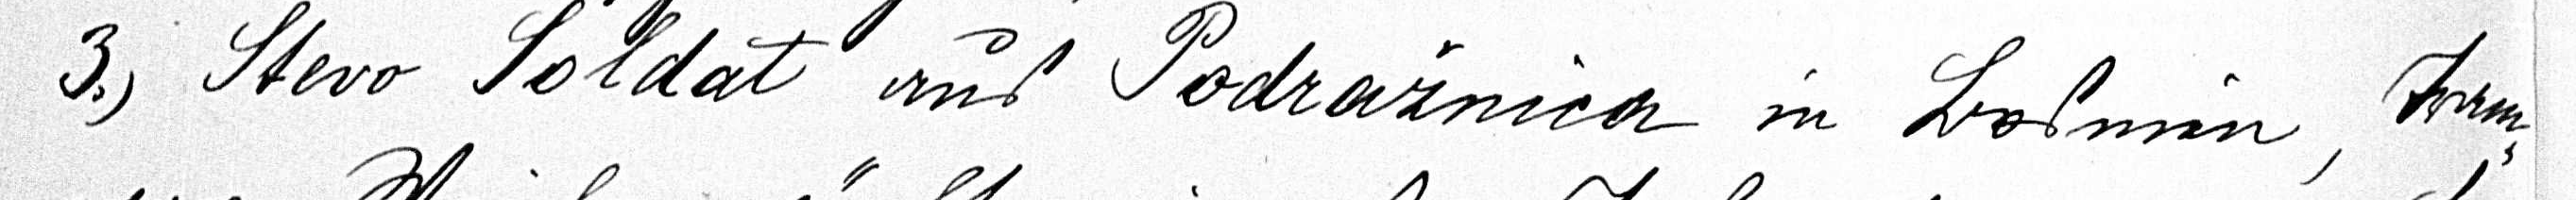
3) Stevo Soldat aus Podrażnica in Bosnien, Tram¬
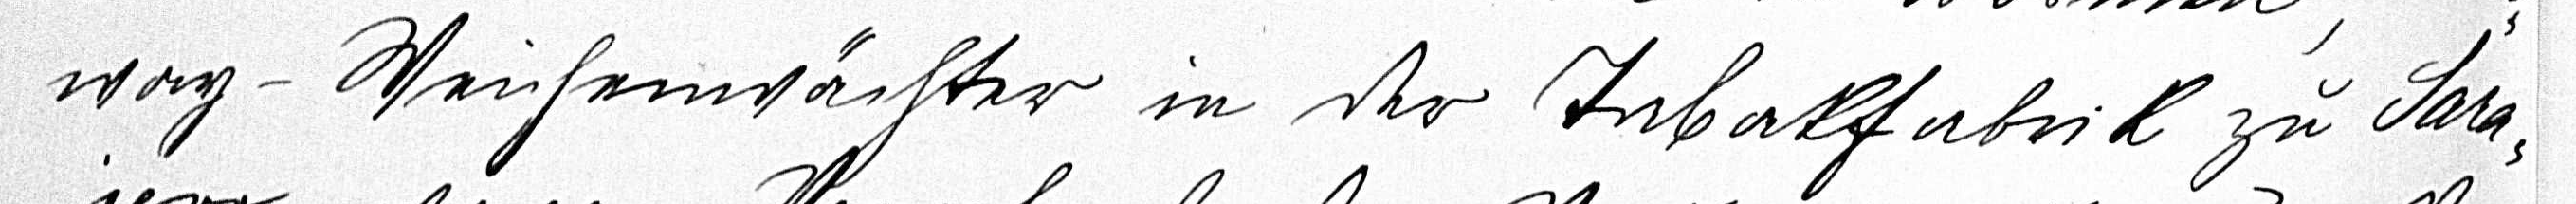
way-Weichenwächter in der Tabakfabrik zu Sara¬
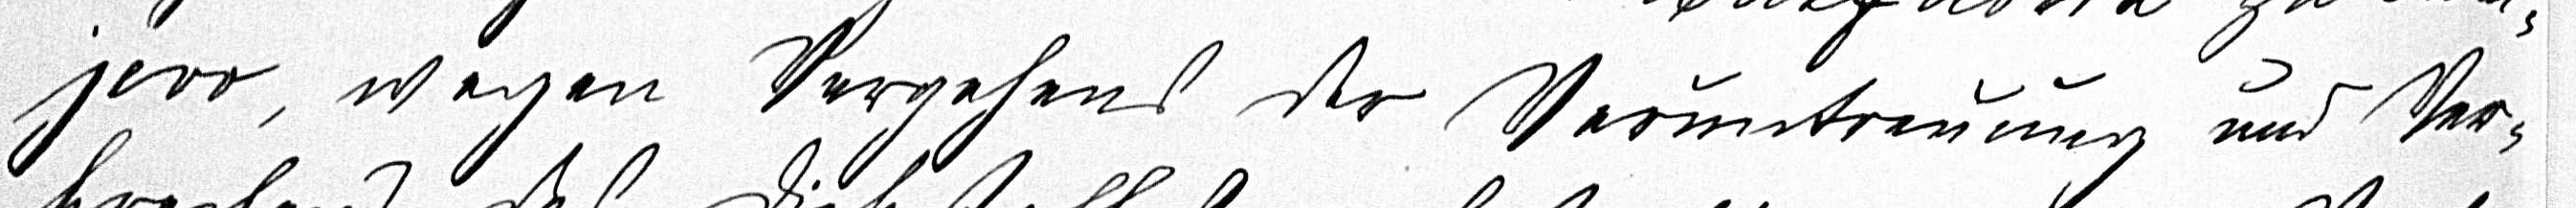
jevo, wegen Vergehens der Veruntreuung und Ver¬
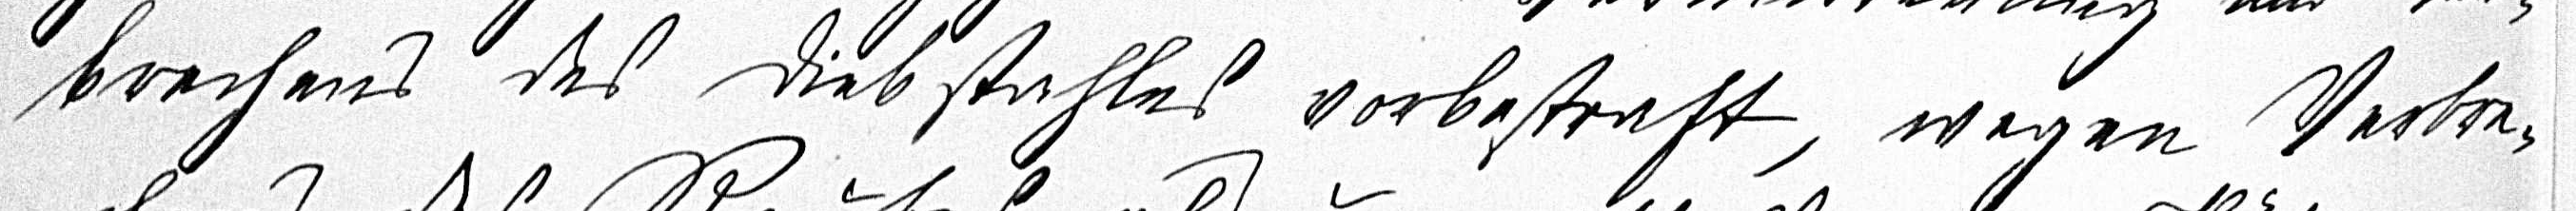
brechens des Diebstahles vorbestraft, wegen Verbre¬
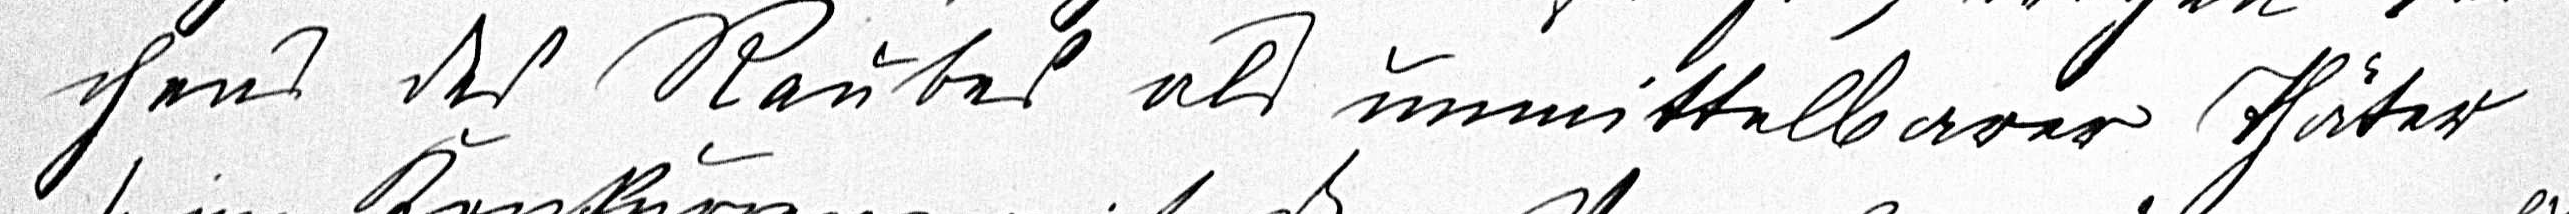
chens des Raubes als unmittelbarer Thäter
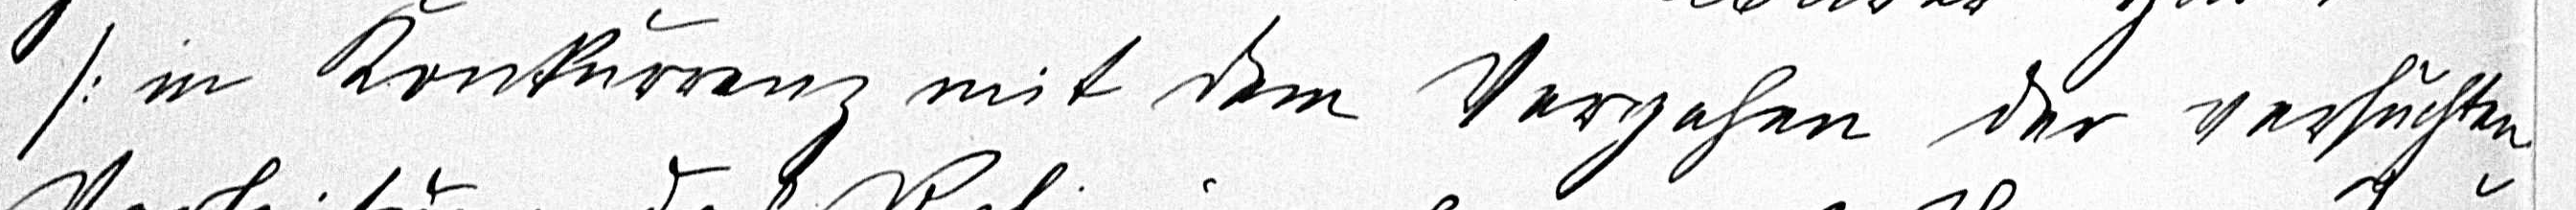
(in Konkurrenz mit dem Vergehen der versuchten
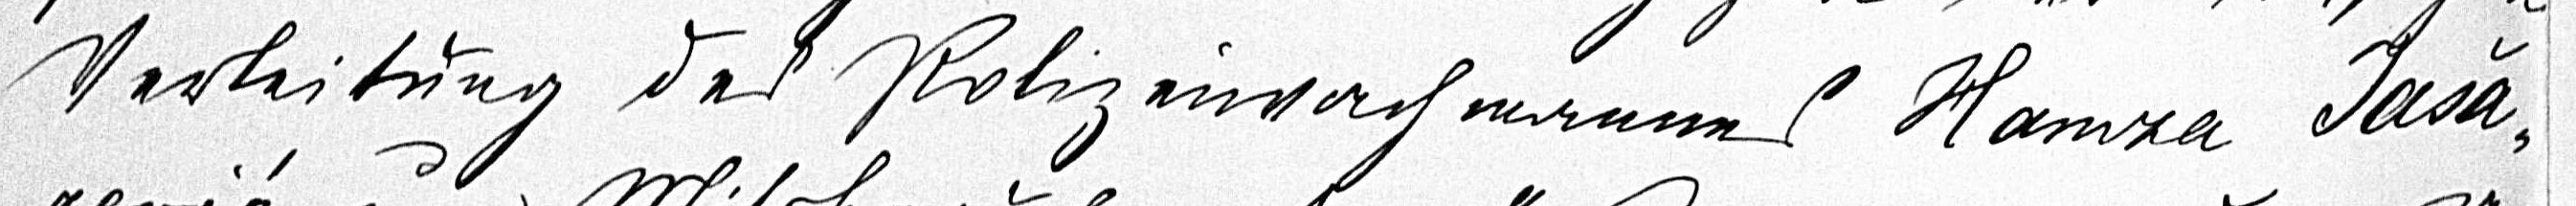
Verleitung des Polizeiwachmannes Hamza Jaša¬
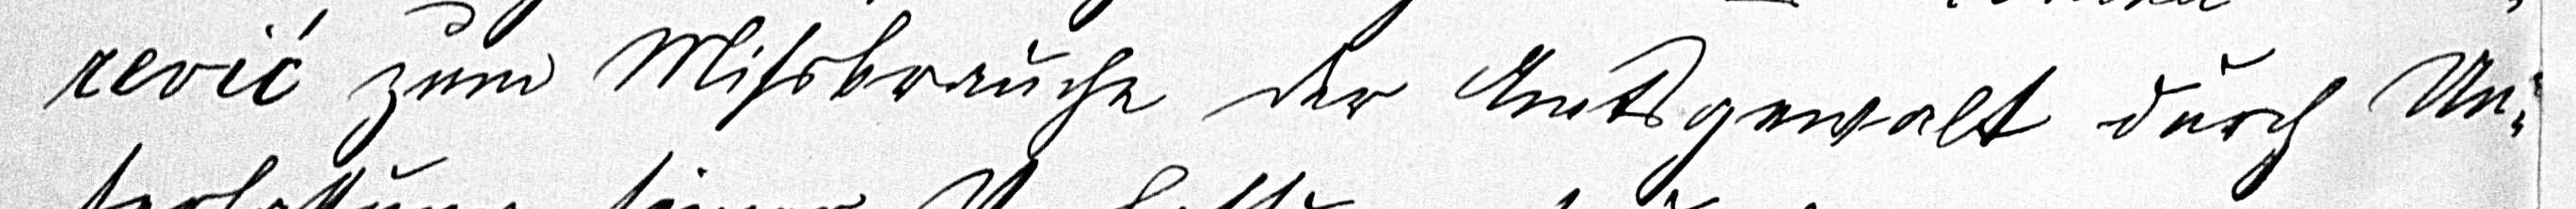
rević zum Mißbrauche der Amtsgewalt durch Un¬
